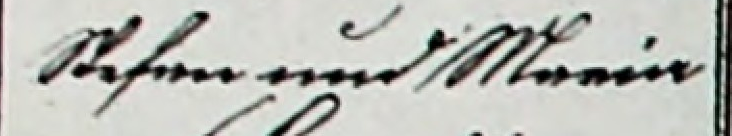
Stefan und Maria
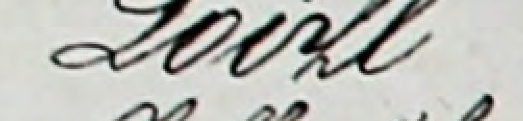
Loizl
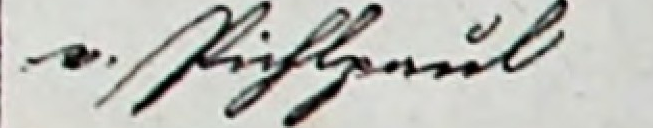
v. Pichlpaul
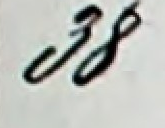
38
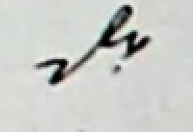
do
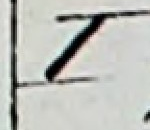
I
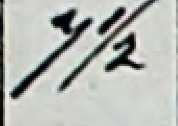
7 ½
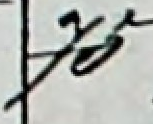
75
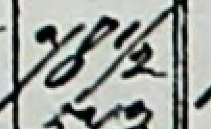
78 ½
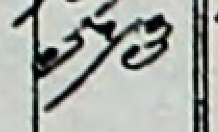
573
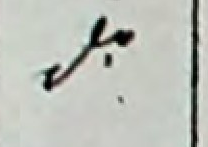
do
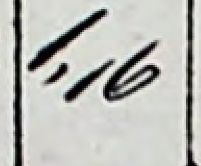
1,16
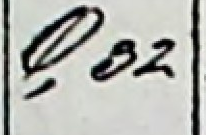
0,32
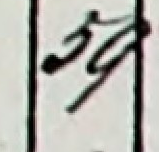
59
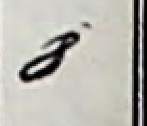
3
